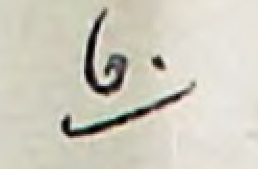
6.
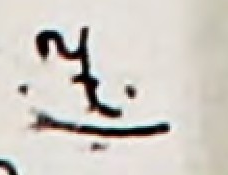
7.
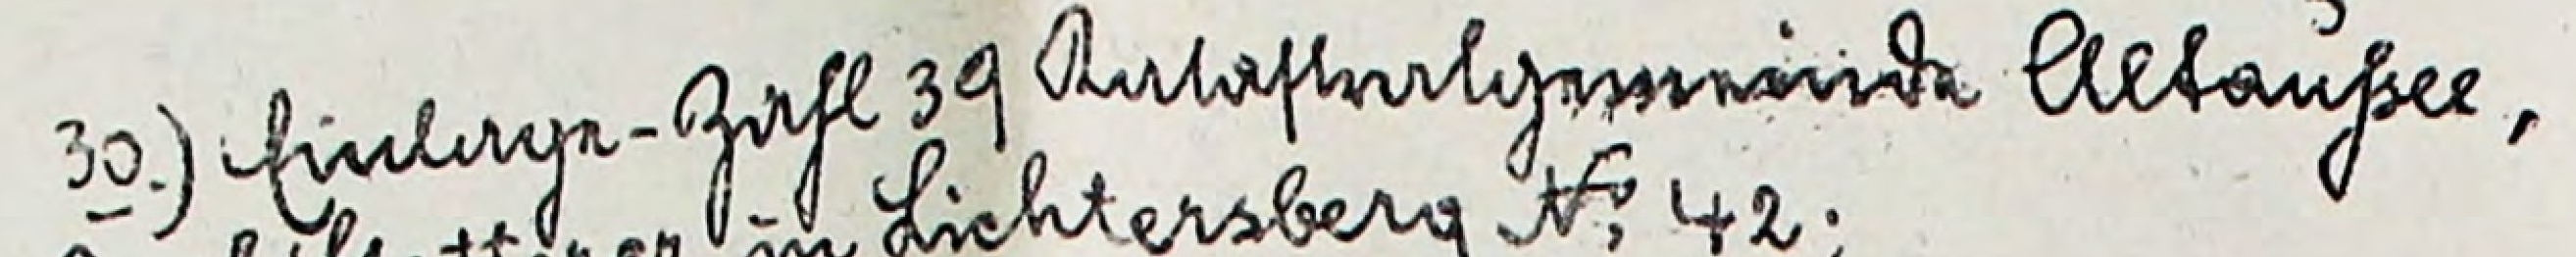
30.) Einlage - Zahl 39 Katastralgemeinde Altaussee,
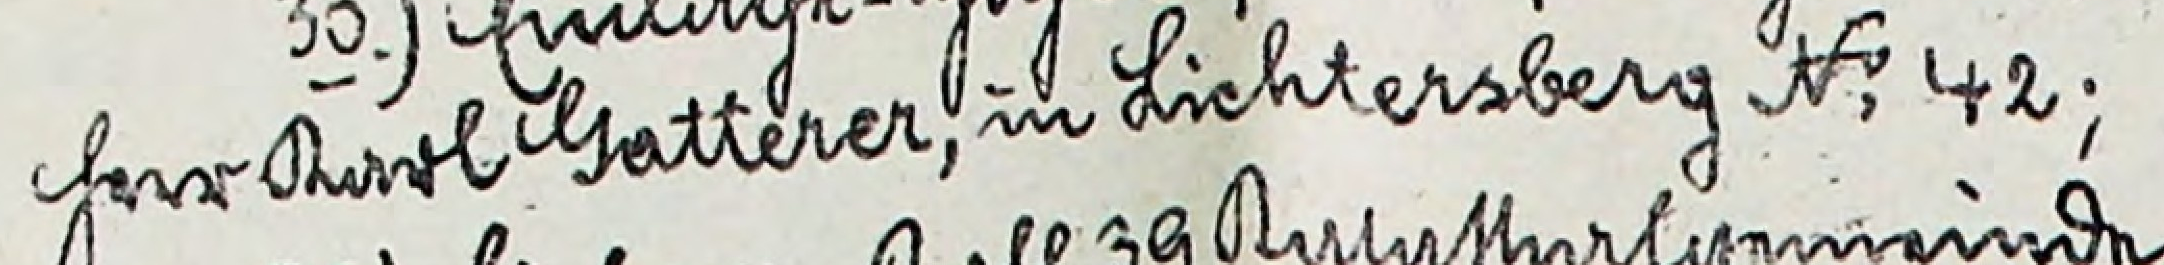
Herr Karl Gatterer, in Lichtersberg No 42;
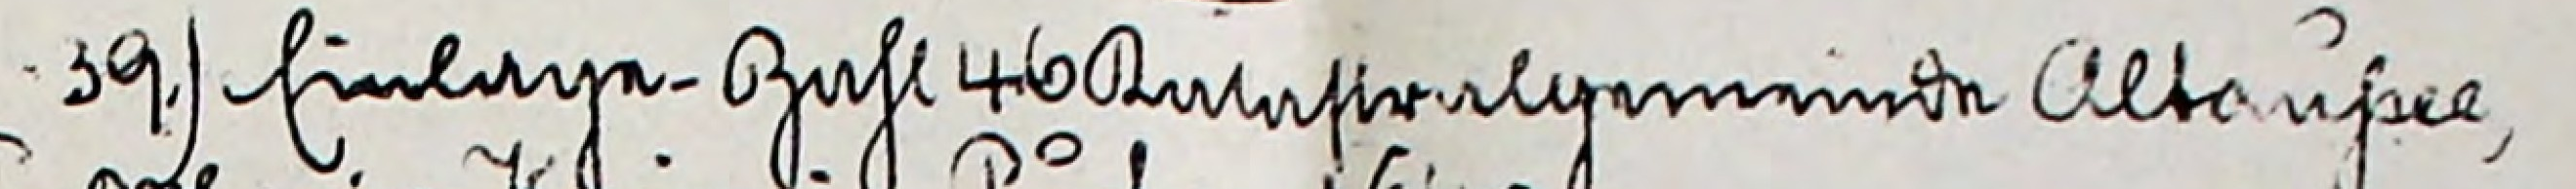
39.) Einlage - Zahl 46 Katastralgemeinde Altaussee,
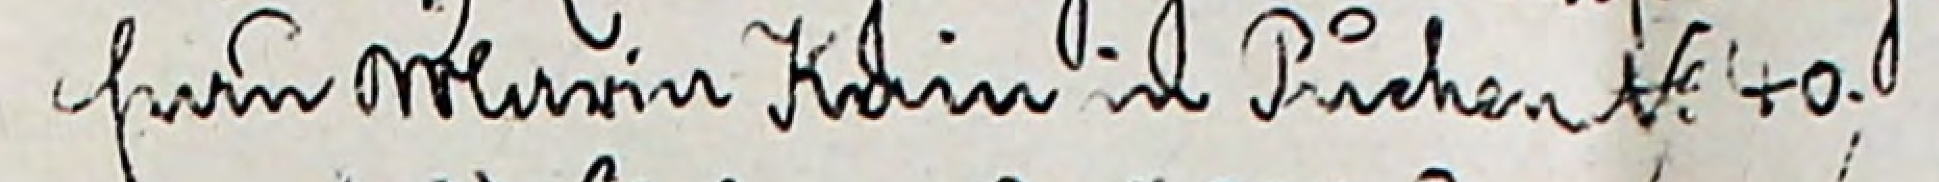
Frau Maria Kain in Puchen No 40;
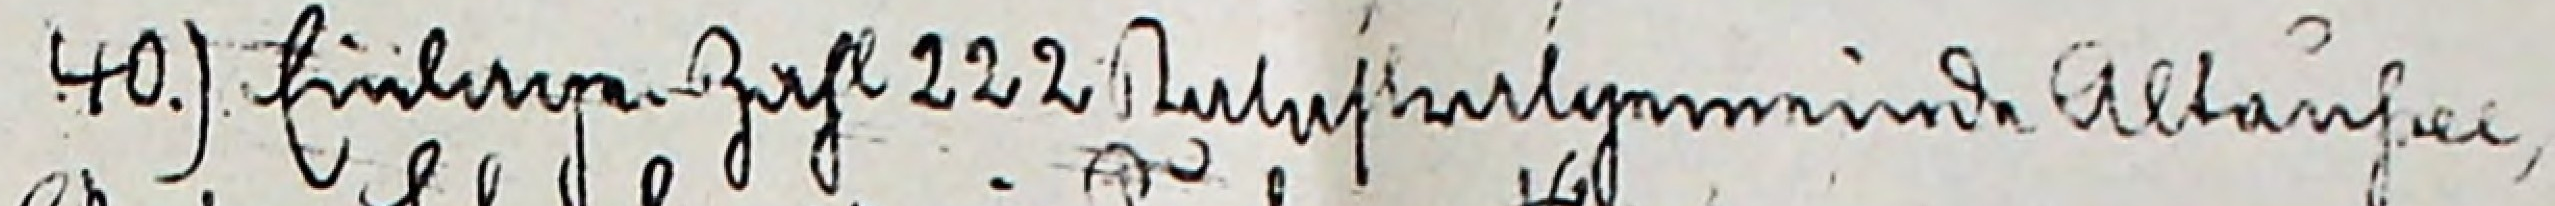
40.) Einlage - Zahl 222 Katastralgemeinde Altaussee,
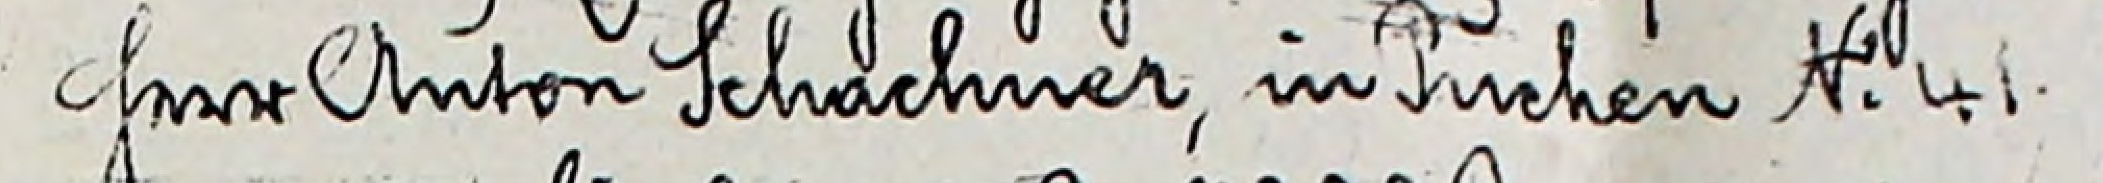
Herr Anton Schachner, in Puchen No 41;
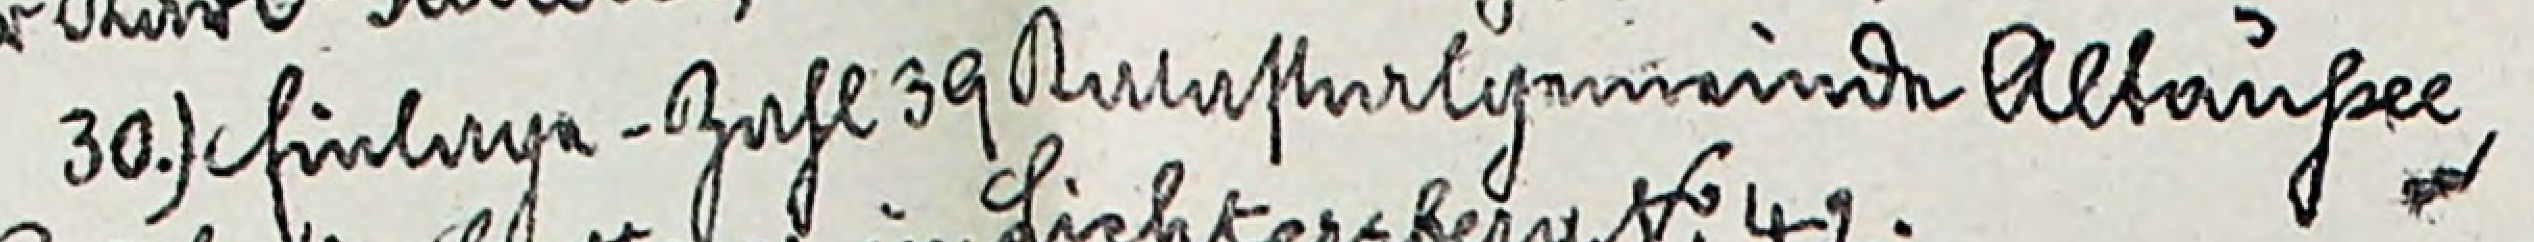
30.) Einlage - Zahl 39 Katastralgemeinde Altaussee,
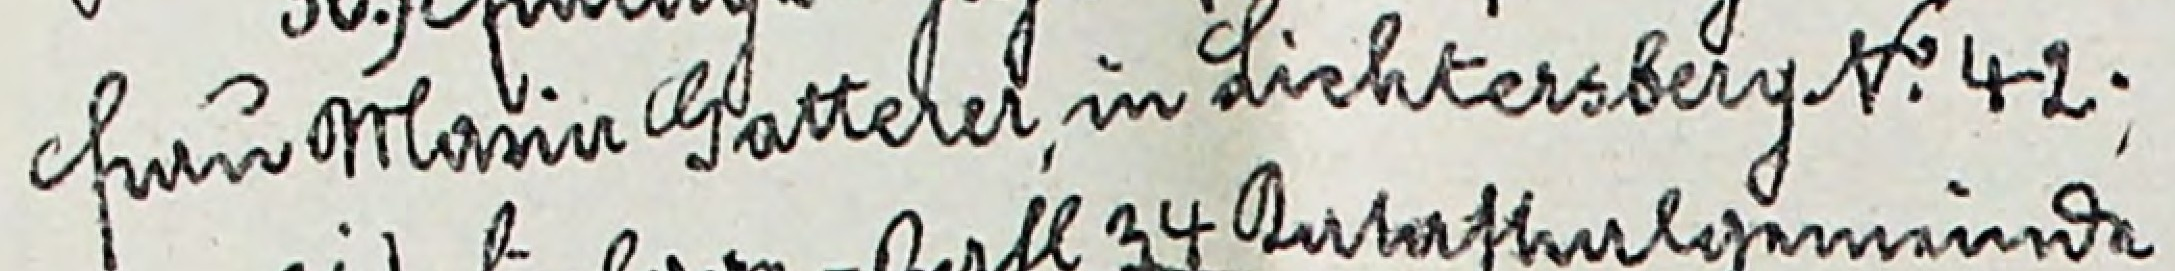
Frau Maria Gatterer, in Lichtersberg No 42;
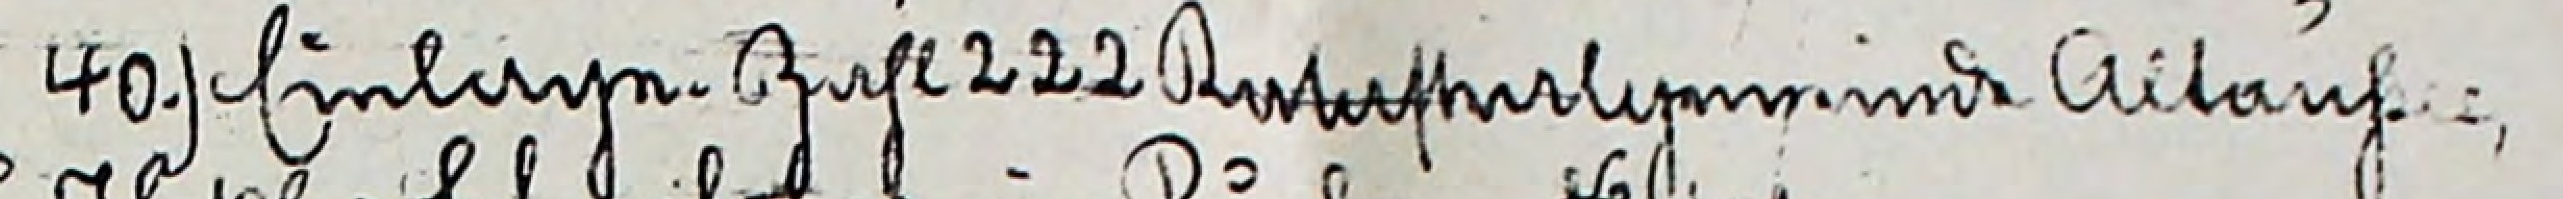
40.) Einlage - Zahl 222 Katastralgemeinde Altaussee,
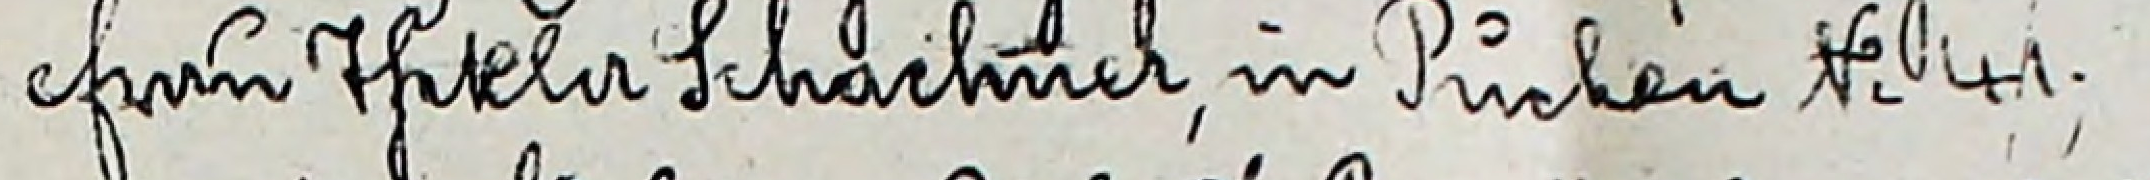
Frau Thekla Schachner, in Puchen No 41;
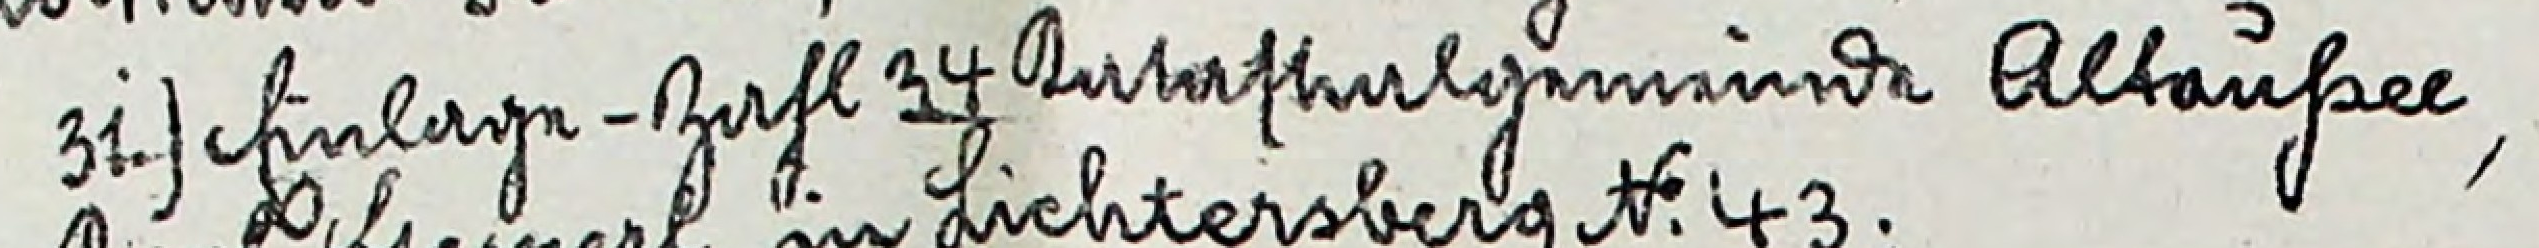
31.) Einlage - Zahl 34 Katastralgemeinde Altaussee,
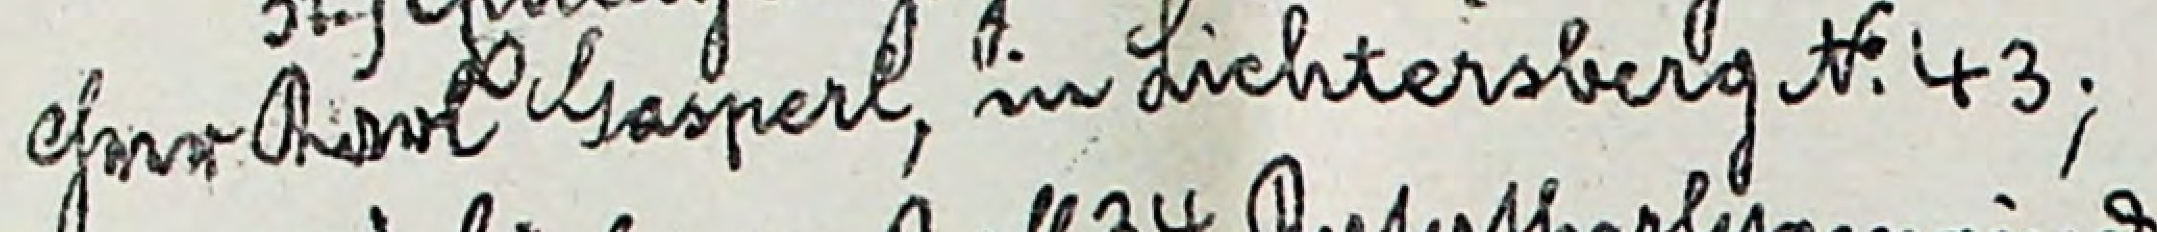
Herr Karl Gasperl, in Lichtersberg No 43;
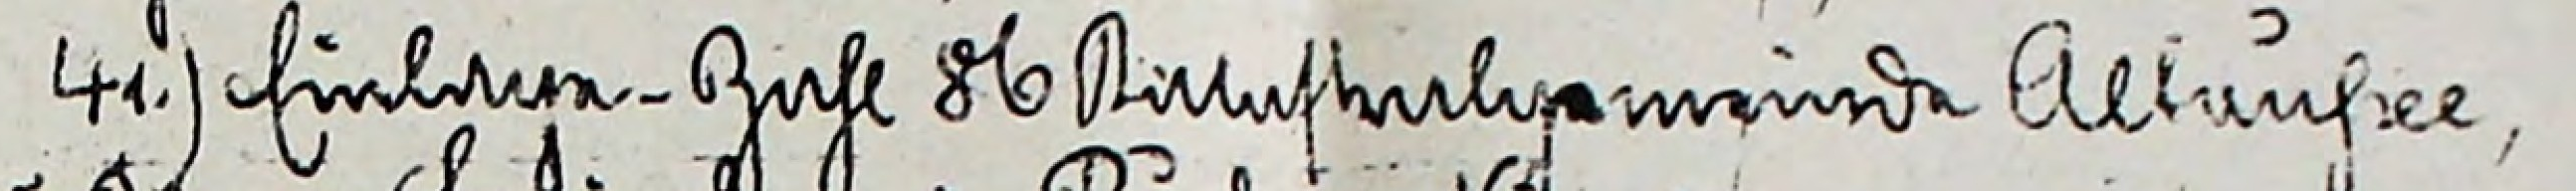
41.) Einlage - Zahl 86 Katastralgemeinde Altaussee,
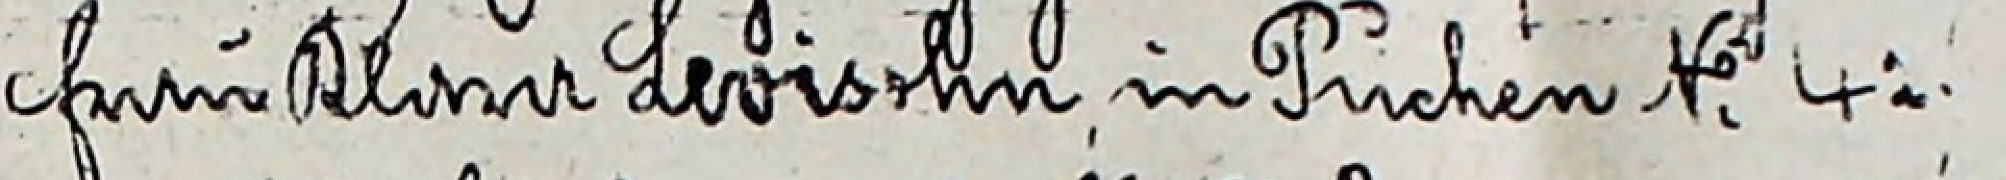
Frau Klara Levisohn, in Puchen No 42;
